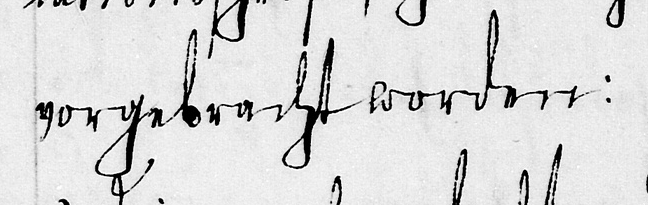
vorgebracht worden:
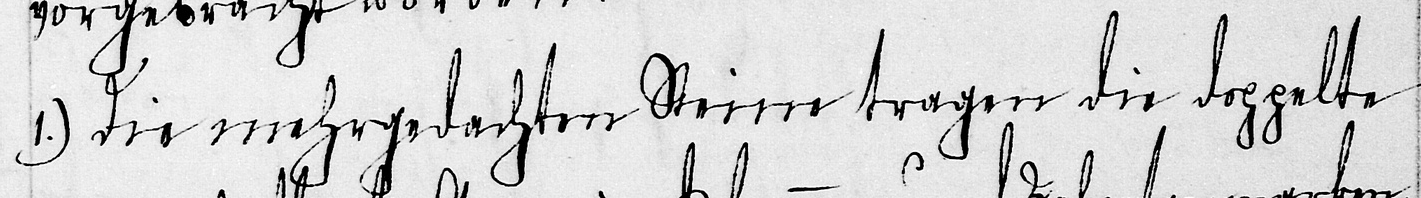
1.) Die mehrgedachten Steine tragen die doppelte
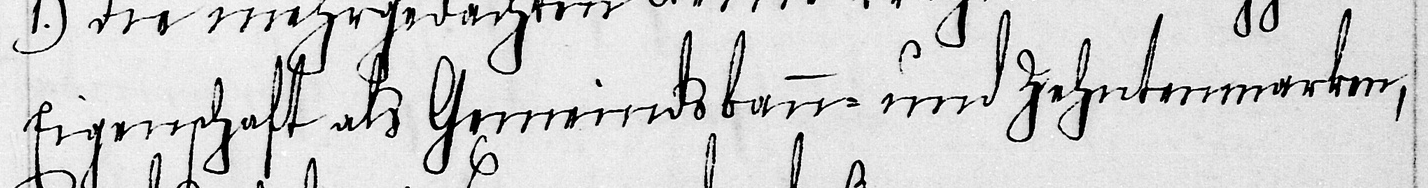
Eigenschaft als Gemeindsbann- und Zehntenmarken,
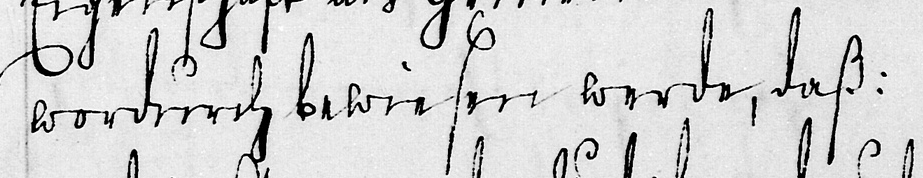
wodurch bewiesen werde, daß:
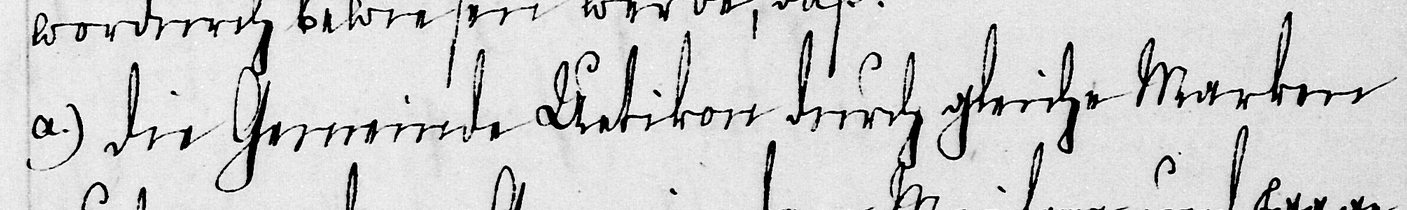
a.) Die Gemeinde Uetikon durch gleiche Marken
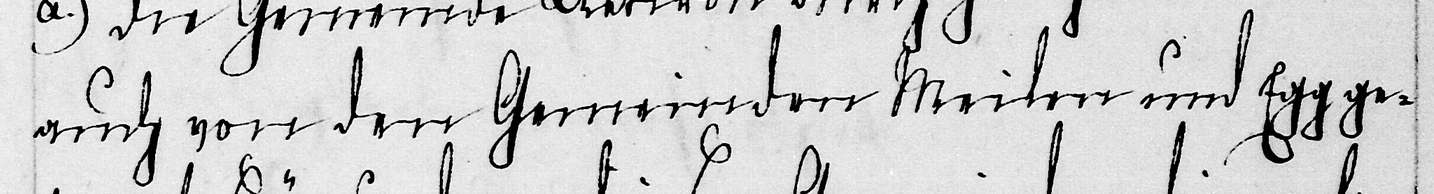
auch von den Gemeinden Meilen und Egg ge¬
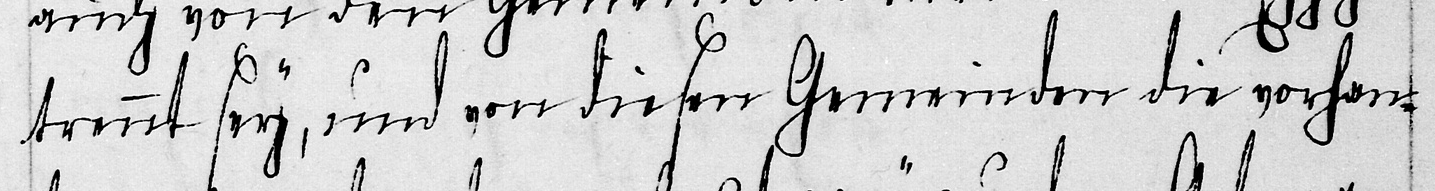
trennt sey, und von diesen Gemeinden die vorhan¬
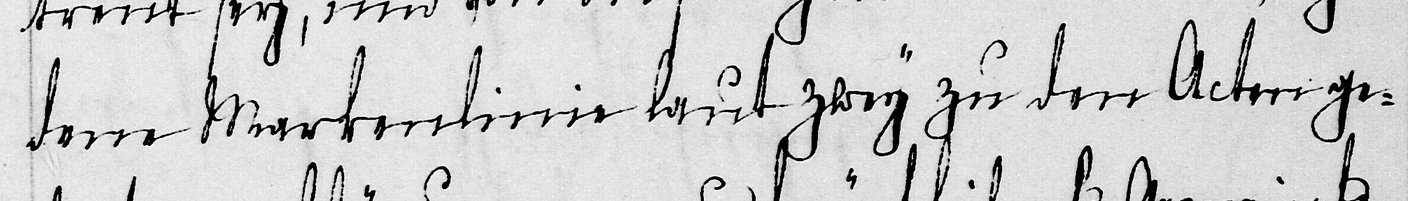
dene Markenlinie laut zwey zu den Acten ge¬
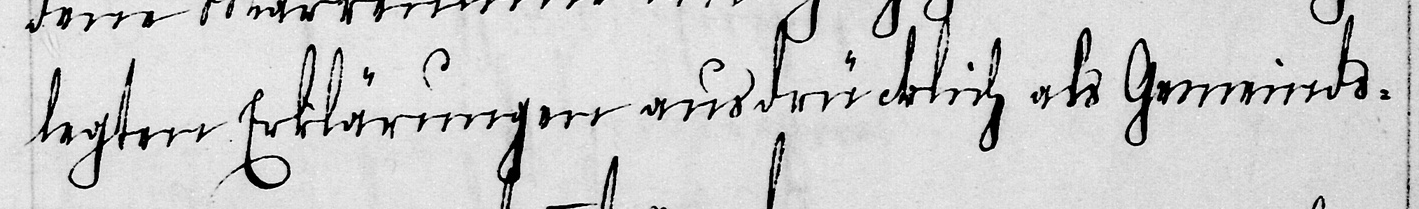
legten Erklärungen ausdrücklich als Gemeinds¬
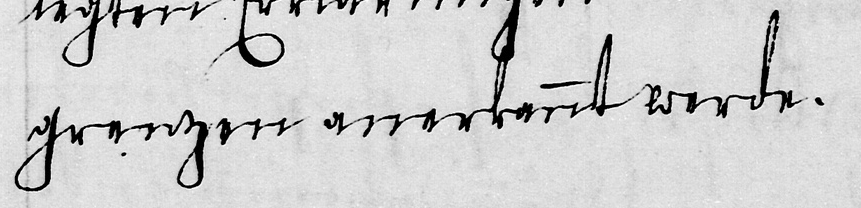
grenzen anerkannt werde.
